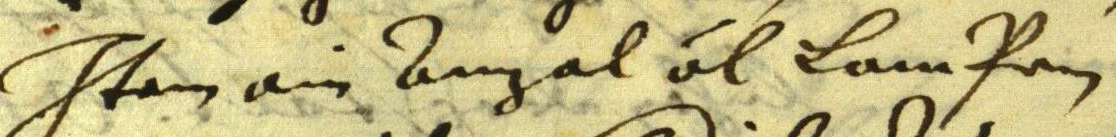Item ain Anzal ōl LamPen
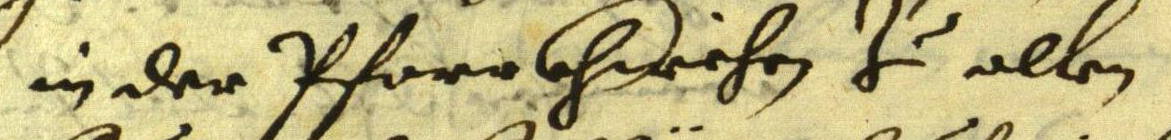in der Pfarrkhirchen Zū allen
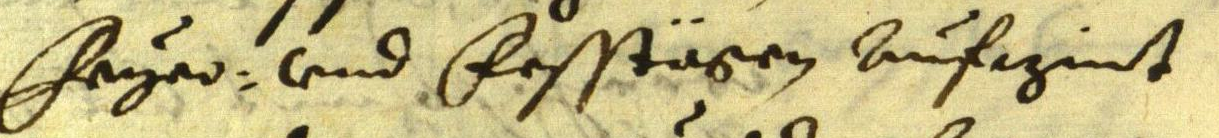Feȳer: vnd Fesstägen Aūfzint
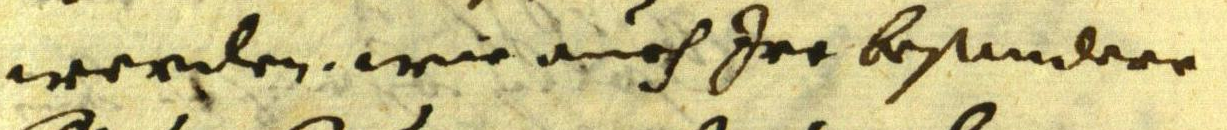werden. wie aūch Ire besondere
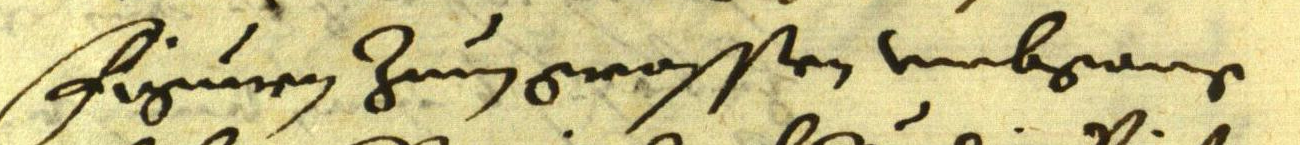Figūren Zūm grossen Vmbgang
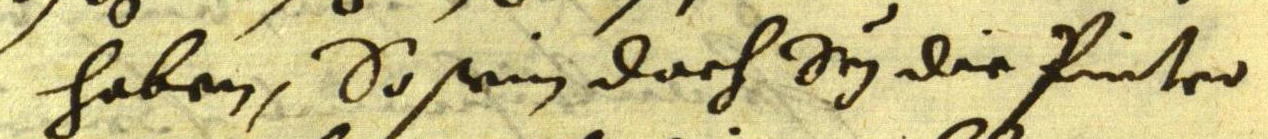haben, So sein doch Sȳ die Pinter
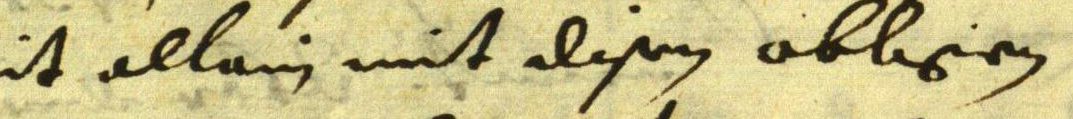nit allain mit disen obligen
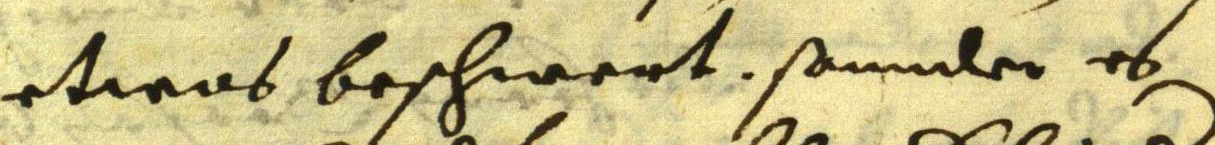etwas beschwert. sonnder es
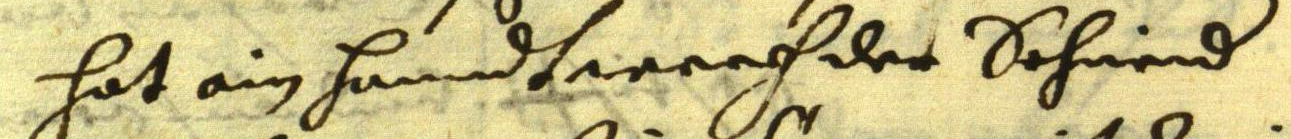hat ain Hanndtwerckh der Schneid
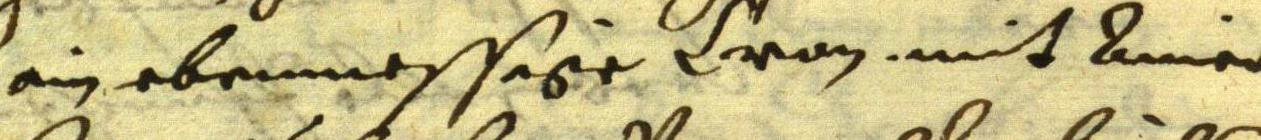ain ebenmessige Cron. mit Ainer
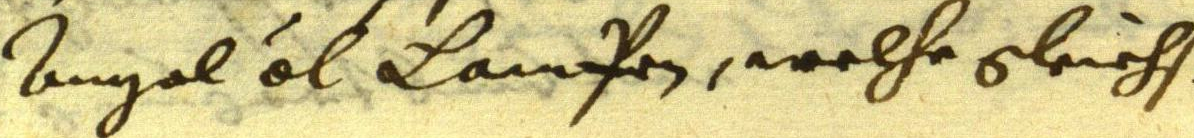Anzal ōl LamPen, welche gleichs¬
